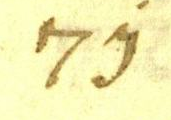71
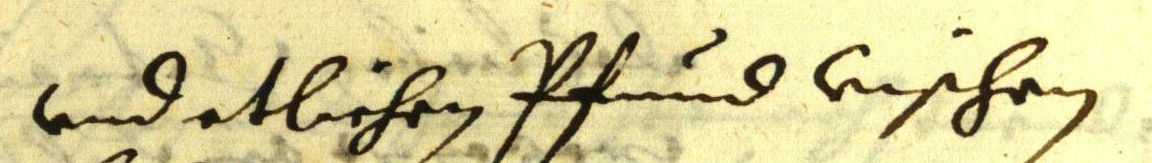vnd etlichen Pfūnd vischen
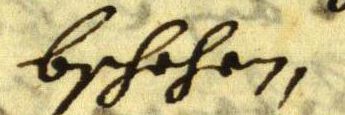bschehen,
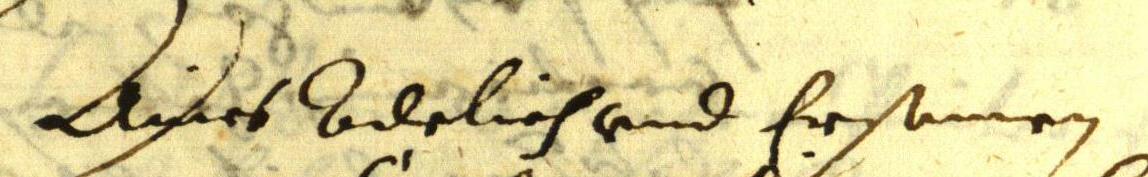Aines Adelich vnd Ersamen
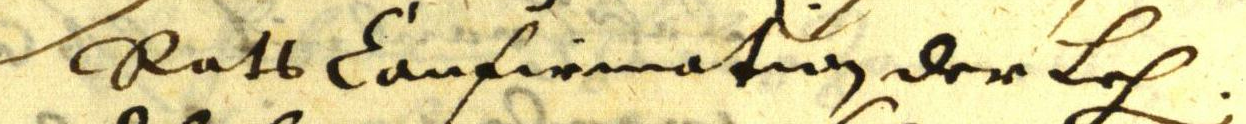Rats Confirmation der Leh.
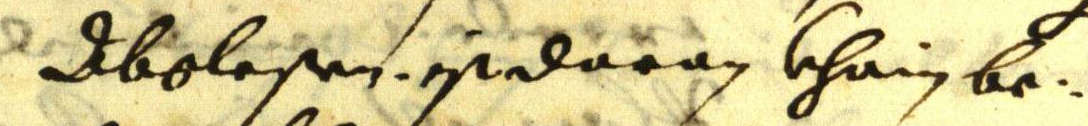Abglesen. ist daran khain be¬
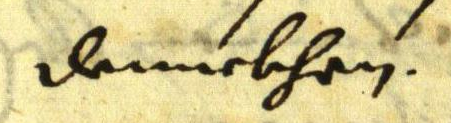dennckhen.
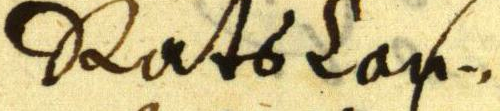Rats Con¬
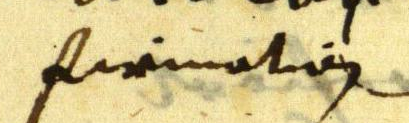firmation
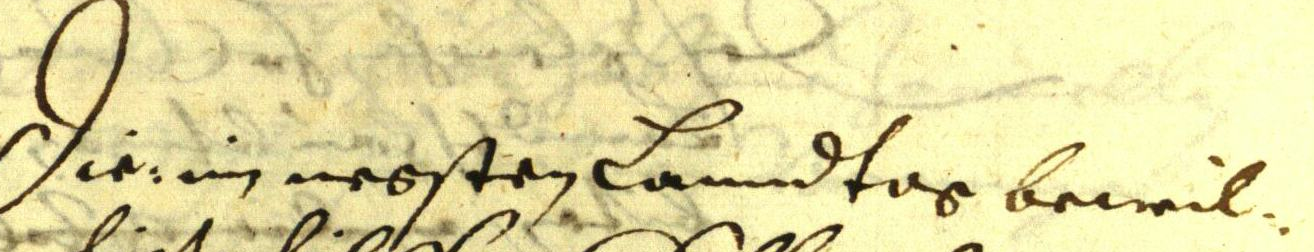Die: im negsten Lanndtag bewil¬
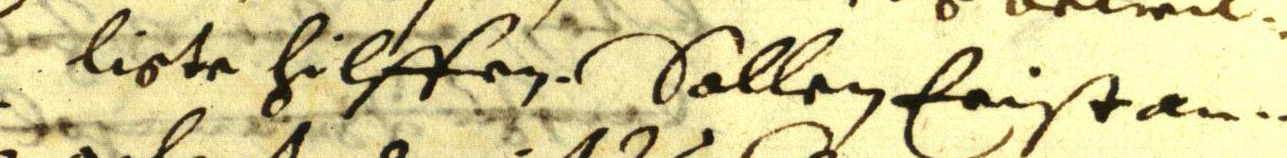ligte hilffen. Sollen Eeist an¬
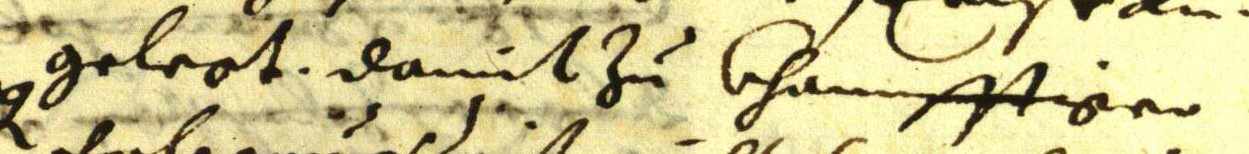gelegt. damit Zū khonnfftiger
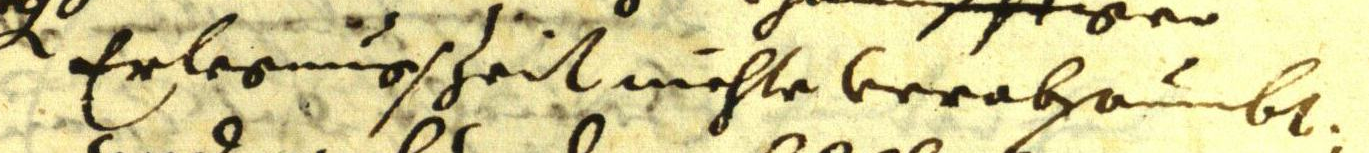Erlegūngszeit nichte verabsaūmbt¬
